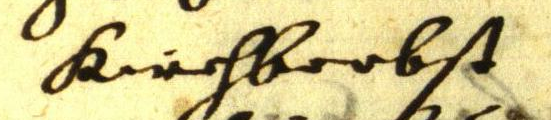Kirchbrobst
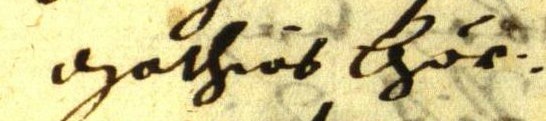Mathias Hōr¬
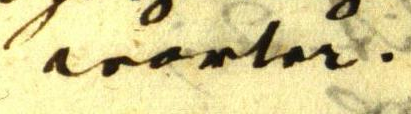warter.
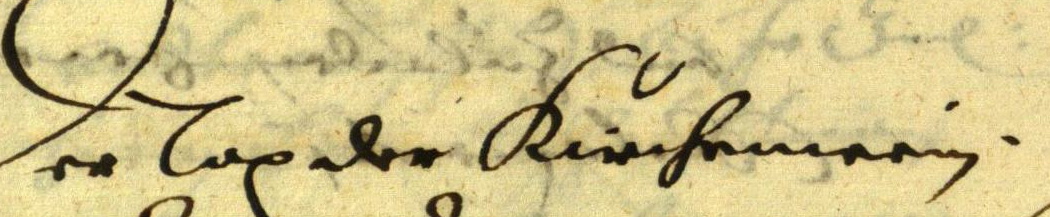Der Tax der Kirchenwein.
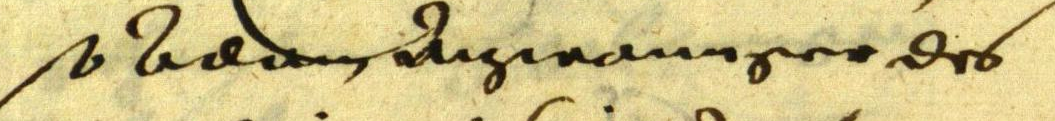so Adam Azwannger des
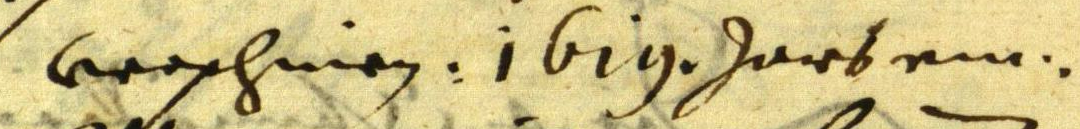verschinen: 1619. Jars em¬
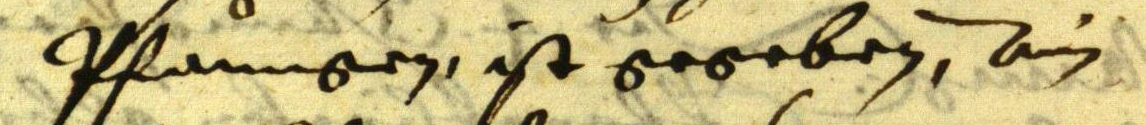Pfanngen, ist gegeben, Ain
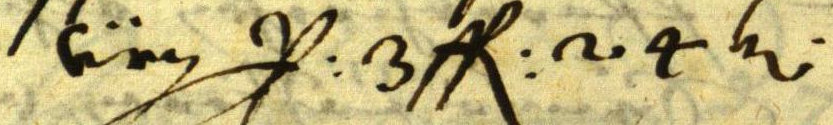v̈rn P: 3 fl: 24 k.
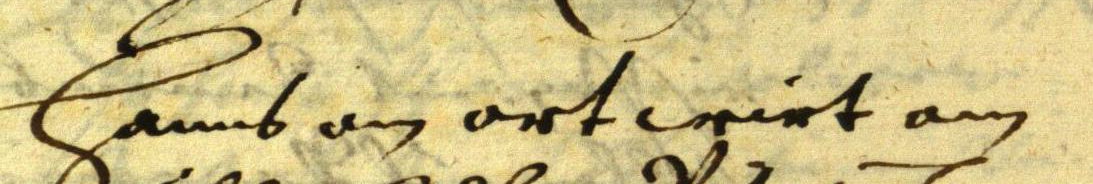Hanns am ort wirt am
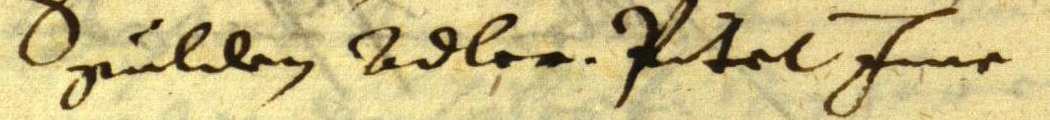gūlden Adler. Pitet Ime
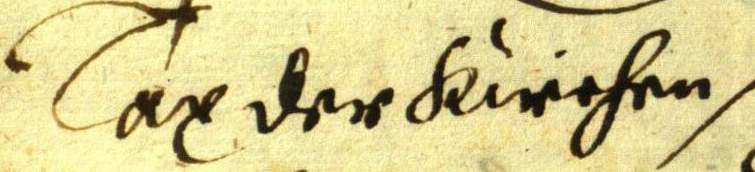Tax der Kirchen
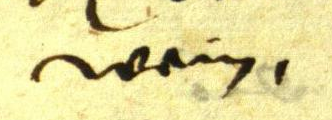wein,
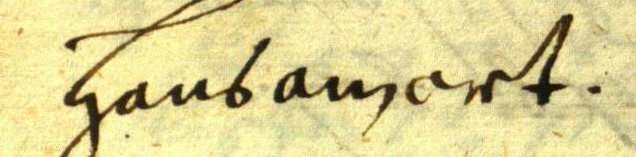Hans am ort.
